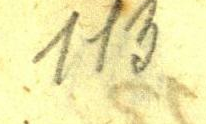113
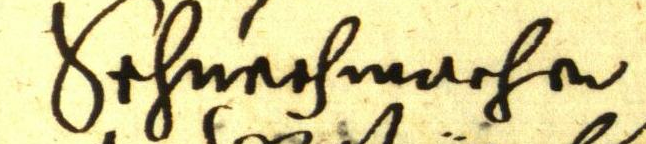Schūechmacher
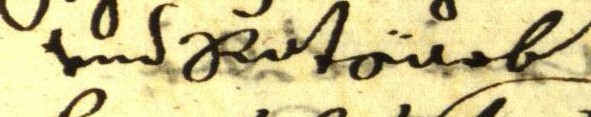vnd Rotgärb
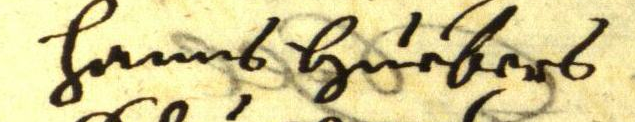hanns Hūebers
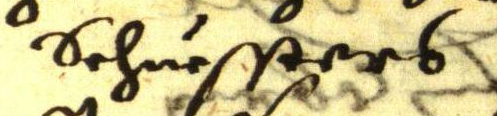Schūessters
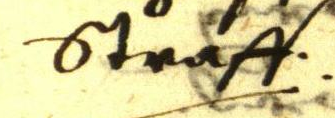Straff.
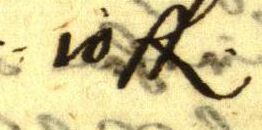—: 10 fl.
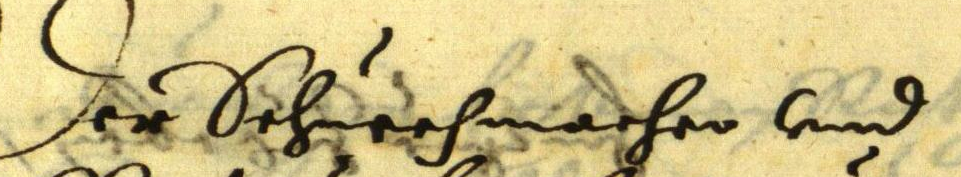Der Schūechmacher vnd
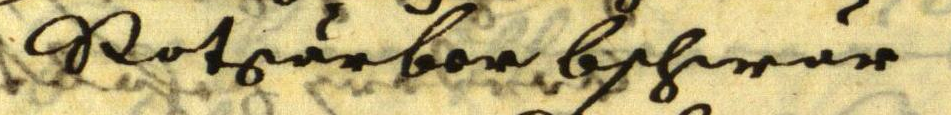Rotgārber beschwār
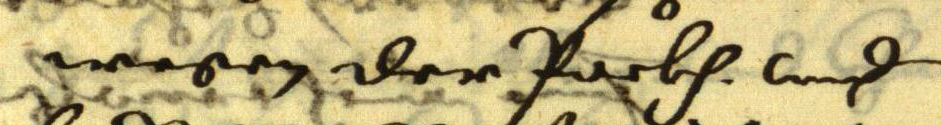wegen der Packh. vnd
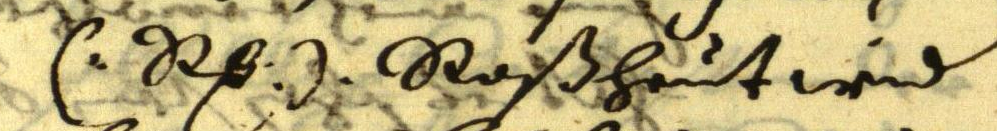(:R.). Roßheūt wid
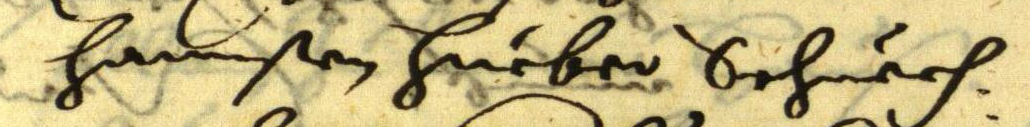hannsen hūeber Schūech¬
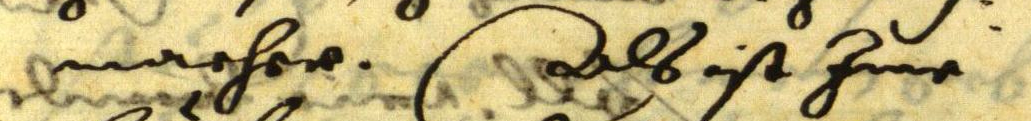macher. Als ist Ime
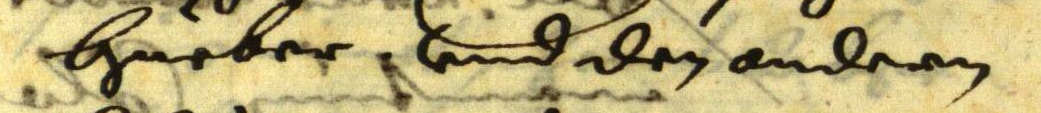Hūeber. vnd den andern
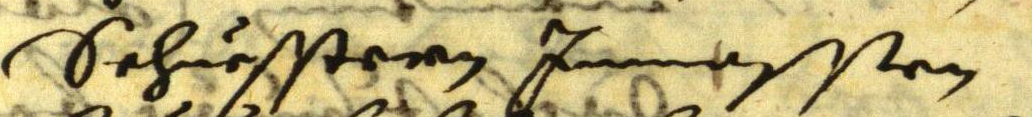Schūesstern Inmassen
